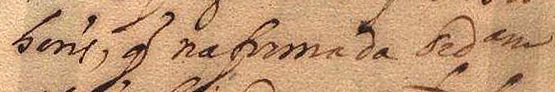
bens, q̄ na forma da ordam
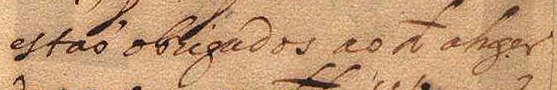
estaõ obrigados ao d̄ aluger
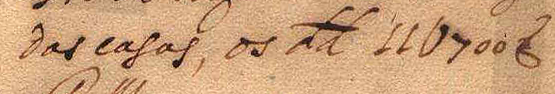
das casas, os d̄d̄ 11$700 rs̄
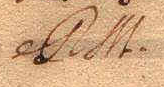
e R. M.
